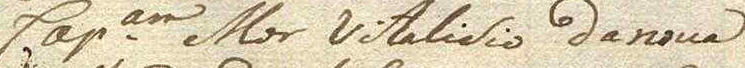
Cap.am Mor vitalisio da noua
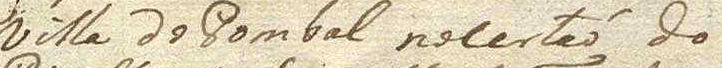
villa do Pombal no certaõ do
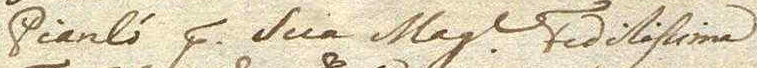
PianCó p̄ sua Mag.e Fedelissima
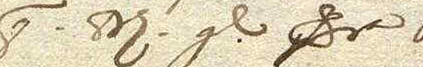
q̄ Ds. g.e &ra
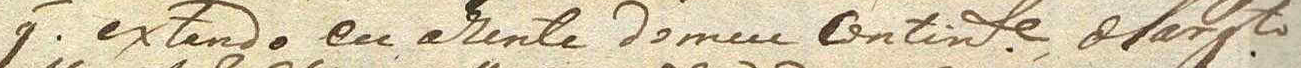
q̄ extando eu aZente do meu contin.te o Sarg.to
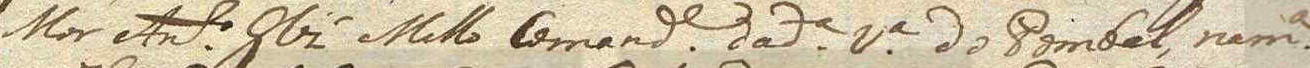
Mor An.to Glz̄ Mello Comand.e da d̄.a v.a do Pombal, na m.a
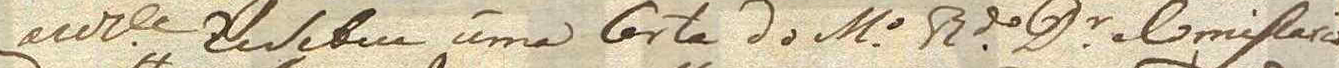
auz.a Resebeu ūma Carta do M.o R.do D.r Comissario
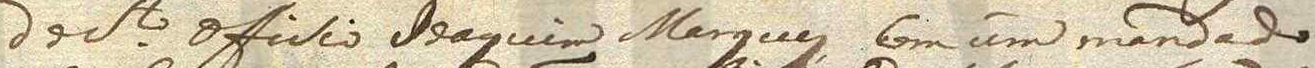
do S.to offisio Ioaquim Marques, Com ūm mandado
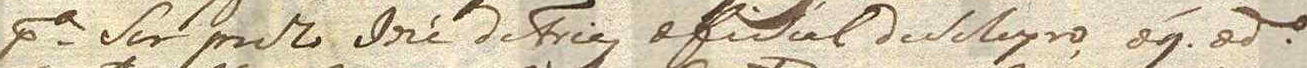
p.a Ser preZo Iozé de Frias ofisial de seleyro, o q̄. o d.o
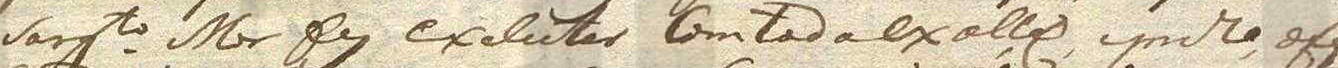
sarg.to Mor fes exeCutar Com toda exaCÇaõ, e preZo, o fes
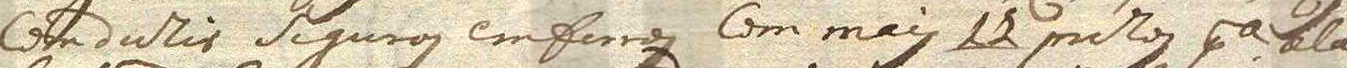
ComduZir seguros em ferros Com mais 11 preZos p.a a Ca
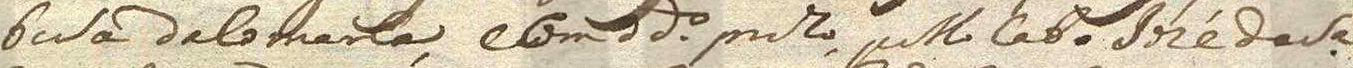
besa da ComarCa, e Com o d̄.o preZo, pello Cabo Iozé da S.a
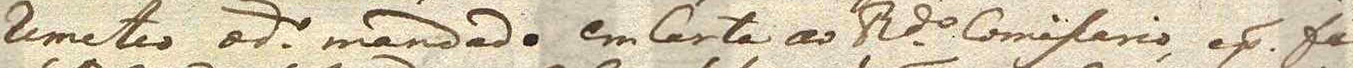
Remeteo o d.o mandado em Carta ao R.do Comissario, e p̄ fa
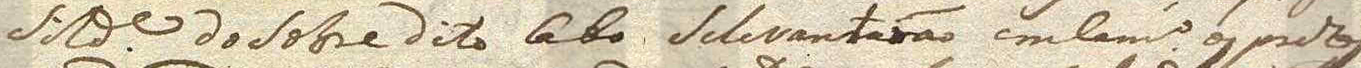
sild.e do sobredito Cabo se levantarão em Cam.o os preZos
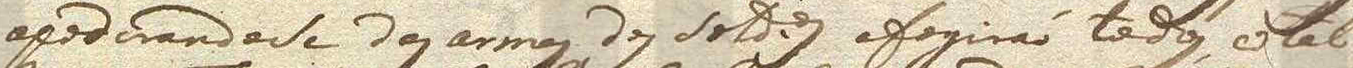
apoderandose das armas dos sold.os e fogiraõ todos, e o tal
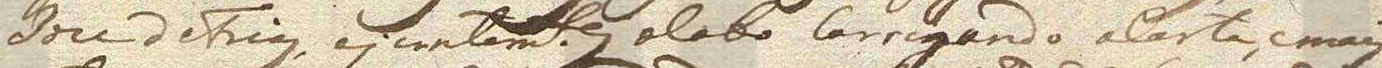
Ioze de Frias, e jumtam.tes o Cabo Carregando a Carta, e mais
